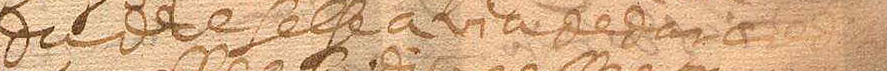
dade e se lhe avia de dar credito
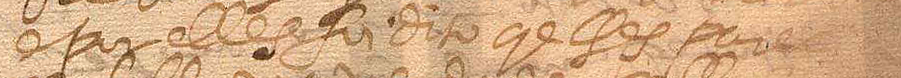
e por elles foi dito qe lhes parecia
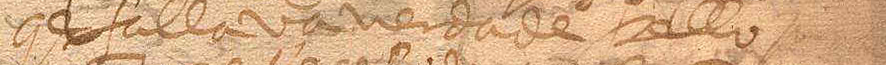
qe fallava uerdade pello
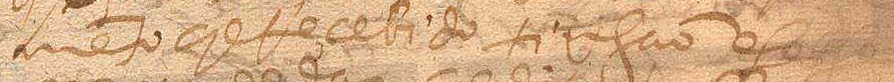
mēto E e Recebido tinhaõ e se
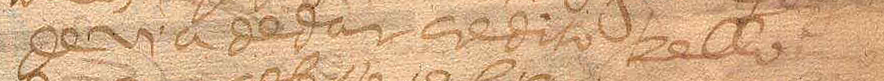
devia de dar credito pello
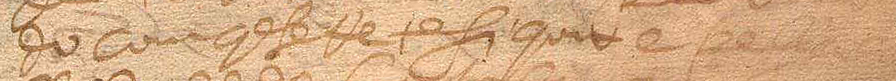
do com qe se Retefiqou e pella ca
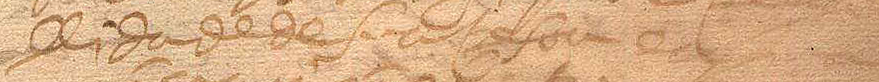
llidade de sua pesoa e
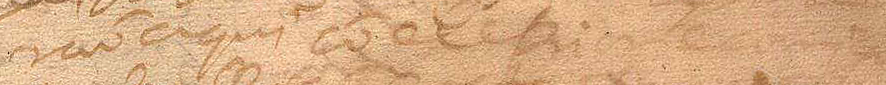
raõ aqui cō ele prior e comigo
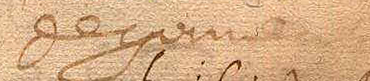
de gomes
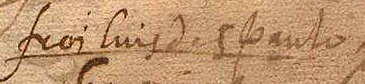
frei luis de s paulo
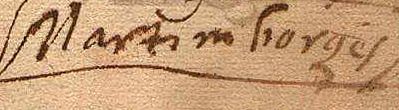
Martim borges
